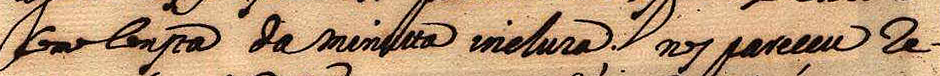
Como Consta da minutta incluza; nos pareceu Re
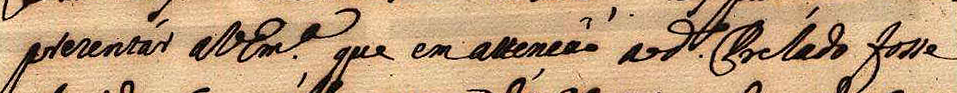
prezentar a V Em.a, que em attençaõ ao d.o Prelado fosse
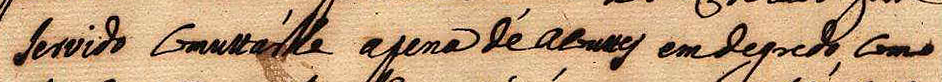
servido Comuttarlhe a pena de açouttes em degredo, como
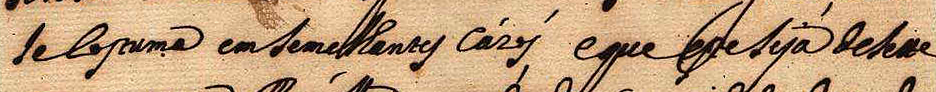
se Costuma em semelhantes cazos, e que este seja de sette
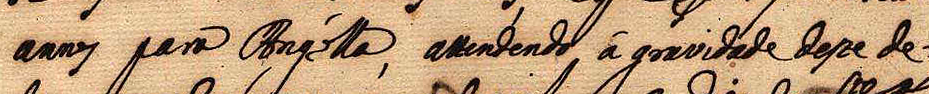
annos para Angolla, attendendo á gravidade deste de
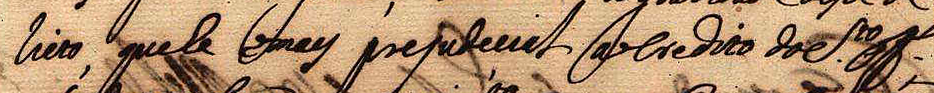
licto, que he o maes prejudeciaL ao credito do S.to off.o,
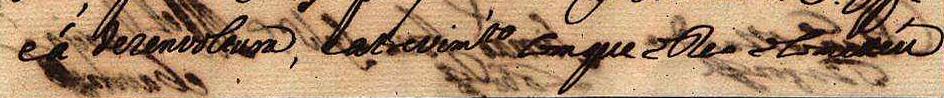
e á dezenvoltura, e atrevimto com que o Reo o Cometteu
